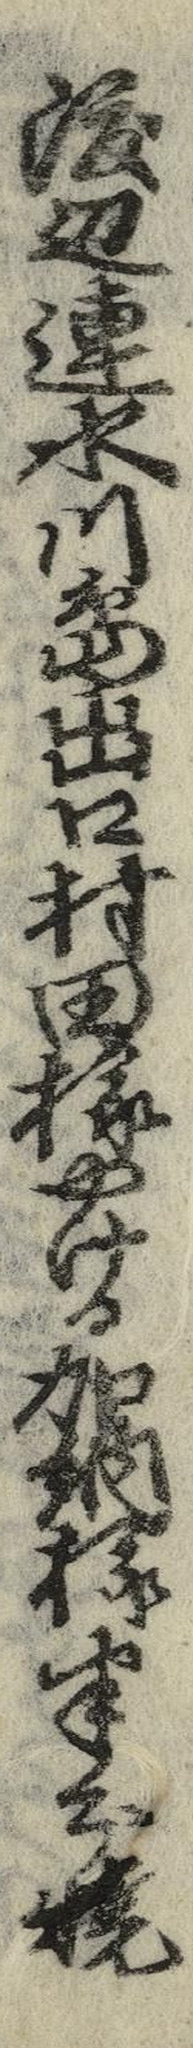渡辺速水川島出口村田様やける加納様半分焼

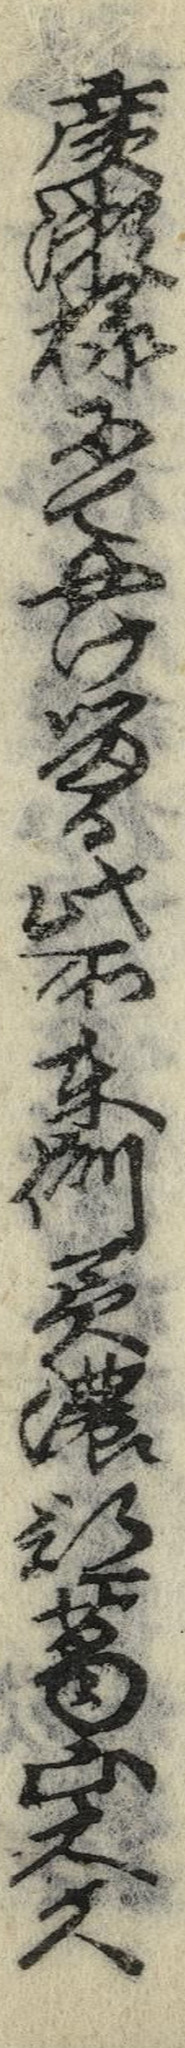廣瀬様にてやけ留る此所東側美濃部葛山大久
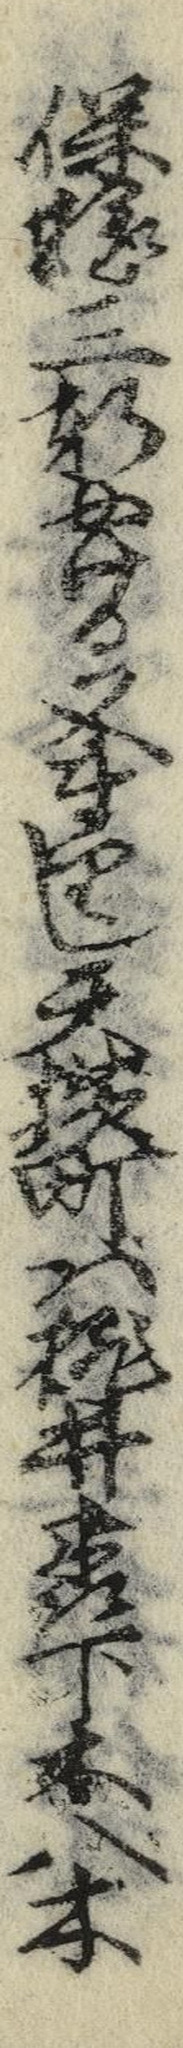保様三軒やける又まりし天横丁は桃井森下大八木
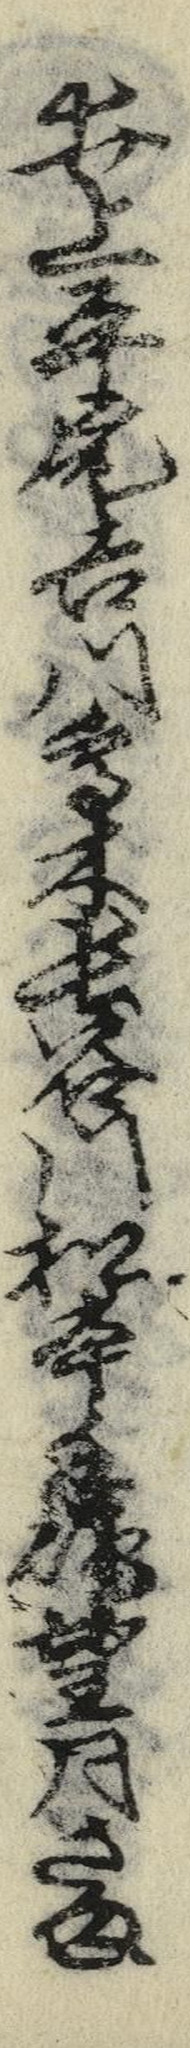井上平尾𠮷川高木長谷川松本手島望月さま
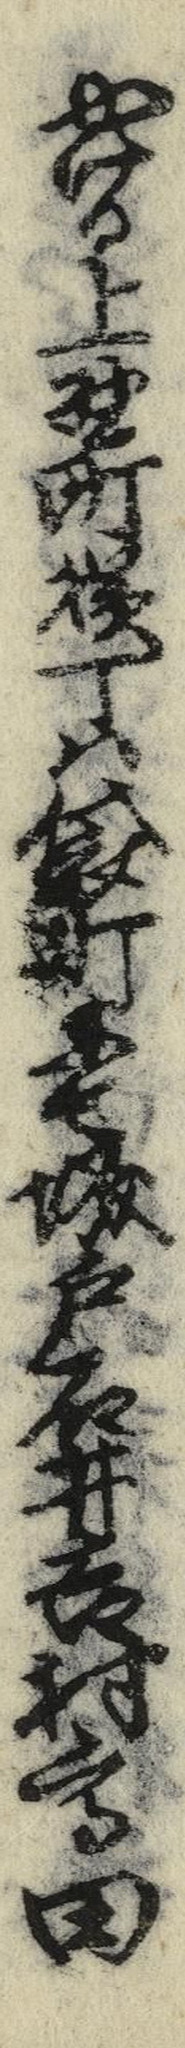やける上野町横町は袋町にて城戸石井吉村高田
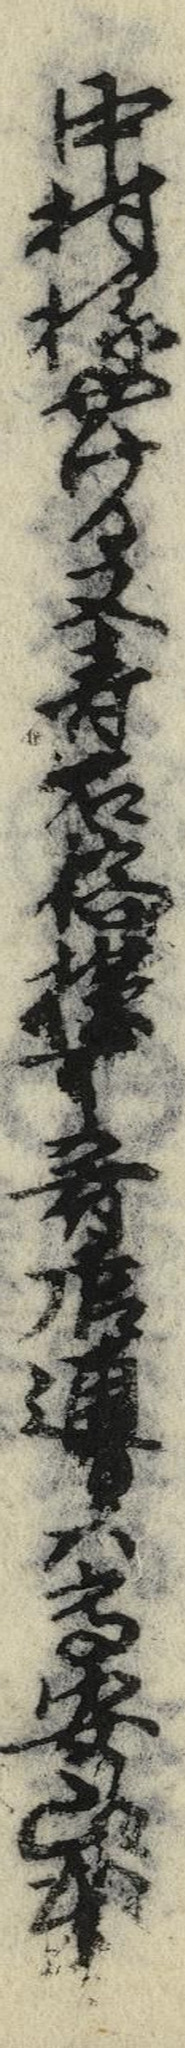中村様やける又青石橋横丁肴店通リは高安山本
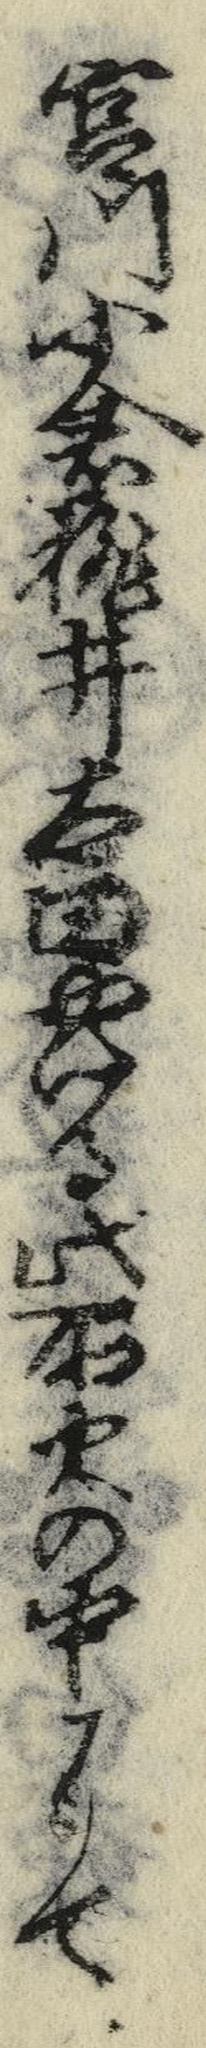宮川小倉桃井太田やける此所火の中にて
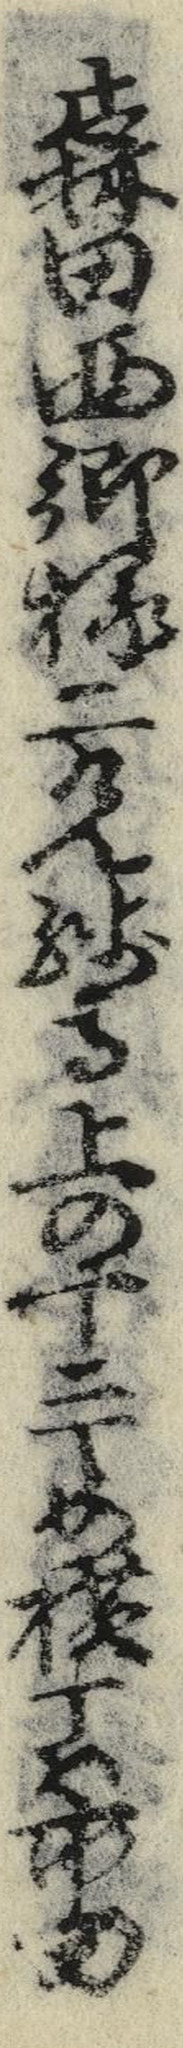森田西郷様二けん残る上の丁二丁め横丁は市田
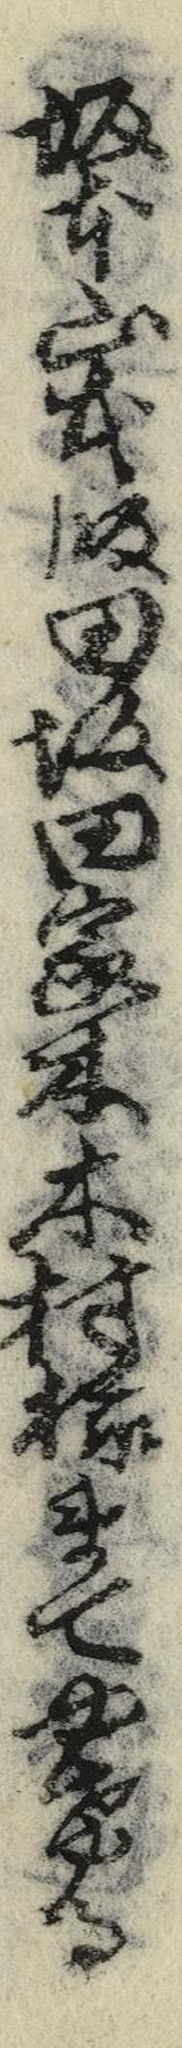坂本山本飯田坂田家来木村様まてやける
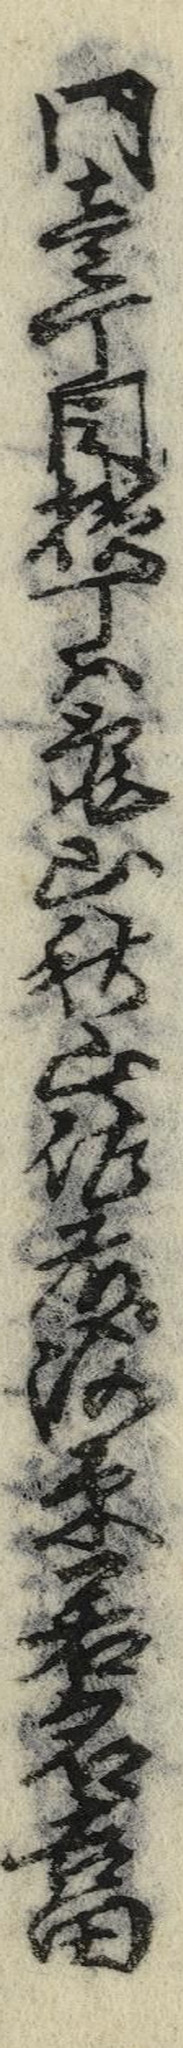同壱丁目横丁は亀山秋山佐藤河原若名吉田
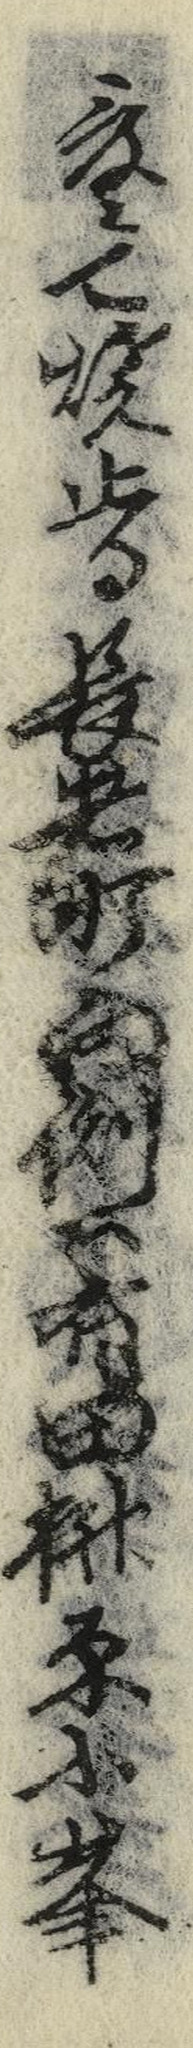爰にて焼止る長者町向側は有田榊原小峰
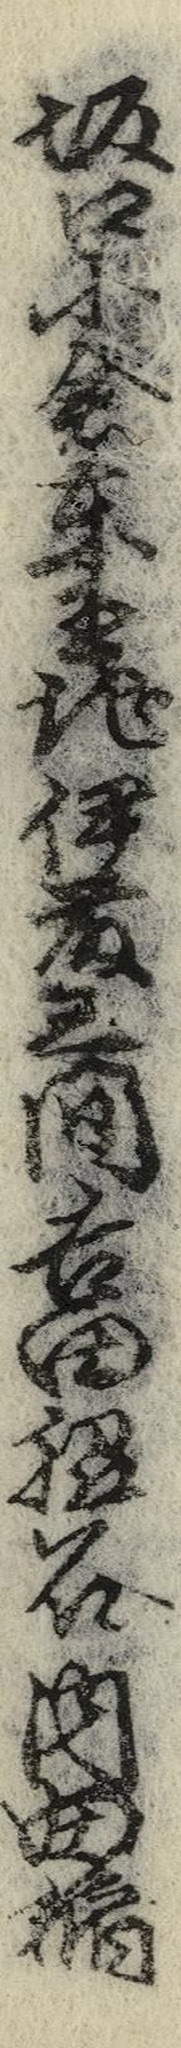坂口小倉東王地伊藤三間𠮷田脇谷内曲稲
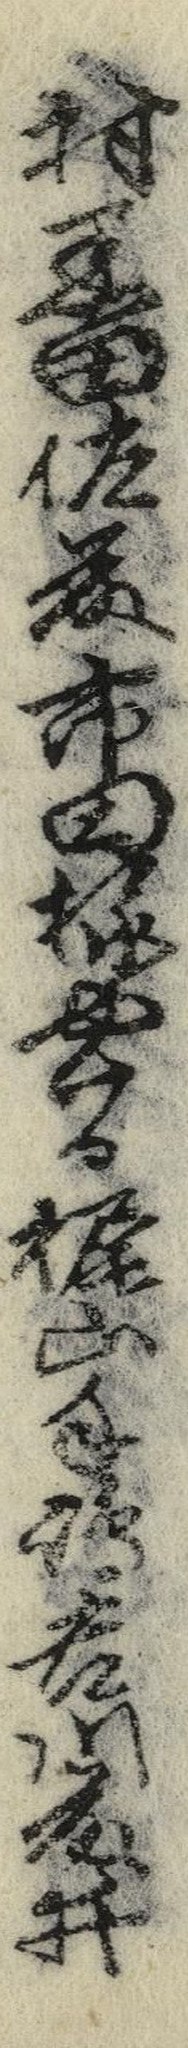村黒田佐藤市田様やける梶山手島吉川藤井
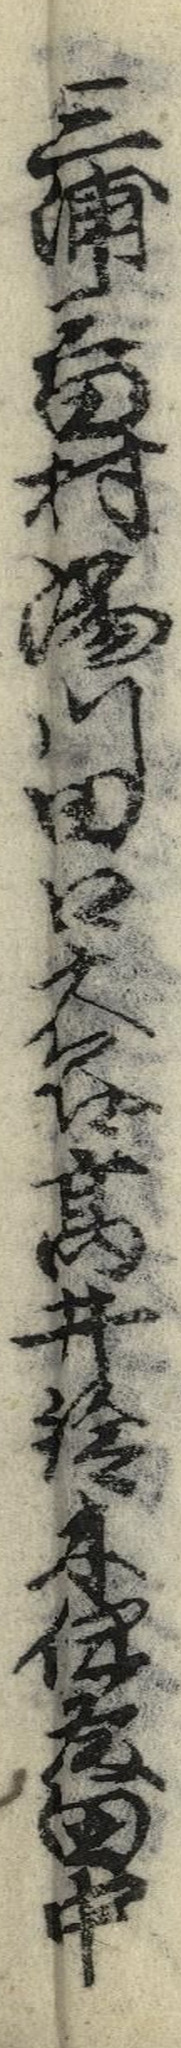三浦三田村湯川田口大谷髙井鈴木伊藤田中
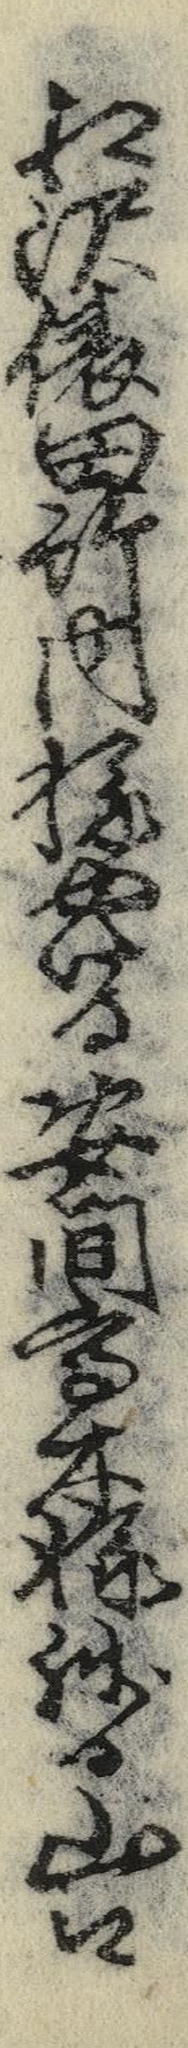相沢俵田竹内様やける安間高木様残る山口
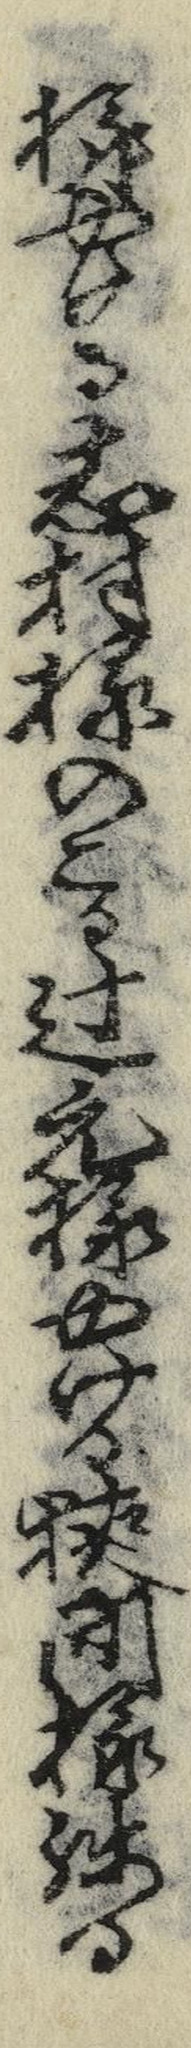様やける志村様のこる辻元様やける狭間様残る
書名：地震類焼場所明細書之写　安政二卯年十月二日夜四ツ時過　御府内御屋敷方市中共、并街道筋近郷聞書
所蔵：東京大学地震研究所図書室 Earthquake Research Institute Library, The University of Tokyo, JAPAN
